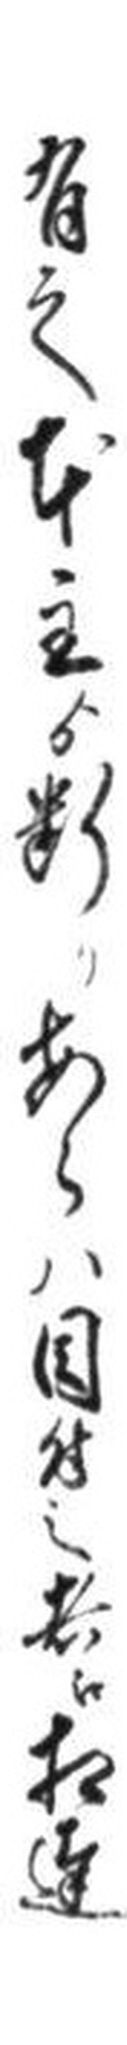有之本主ゟ断りあらハ目付之者江相達
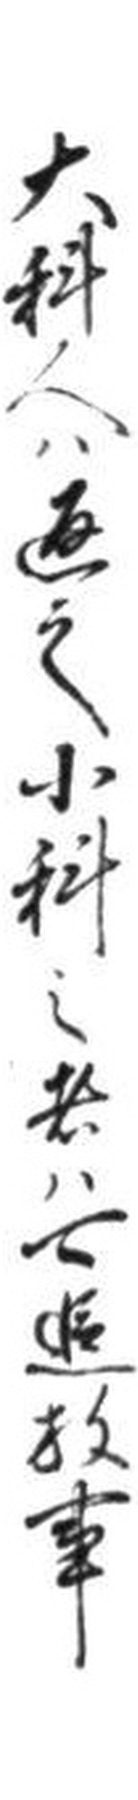大科人ハ返之小科之者ハ可追放事
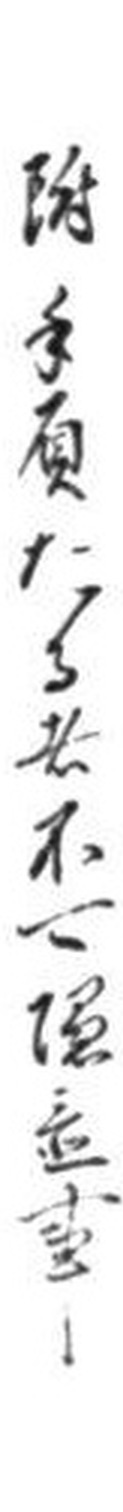附手負たる者不可隠置事
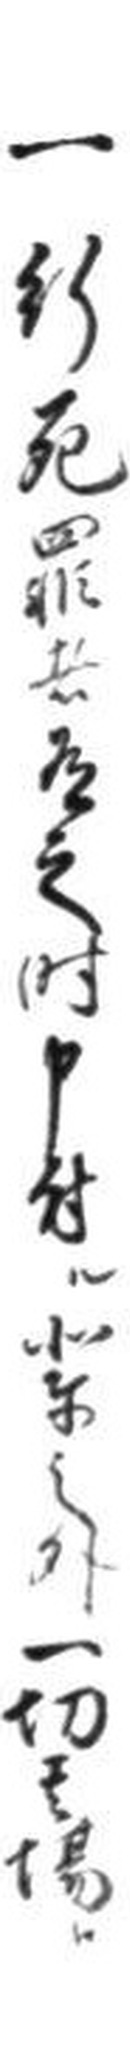一行死罪者有之時申付ル輩之外一切其場江
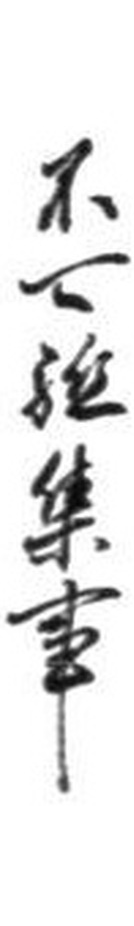不可駈集事
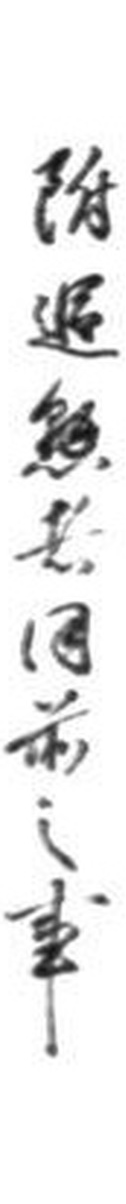附追懸者同前之事
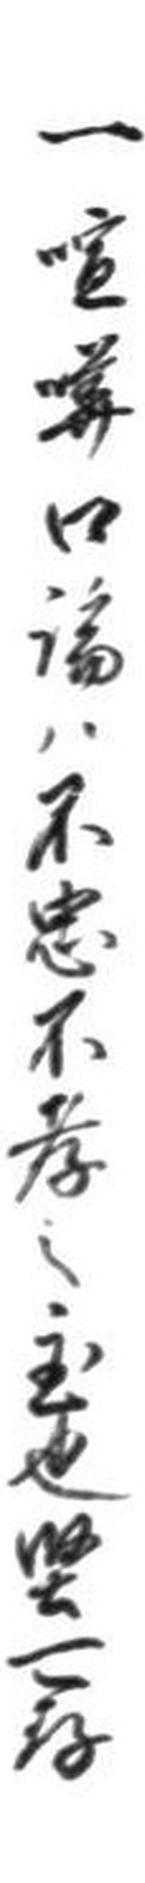一喧嘩口論は不忠不孝之至也堅可存
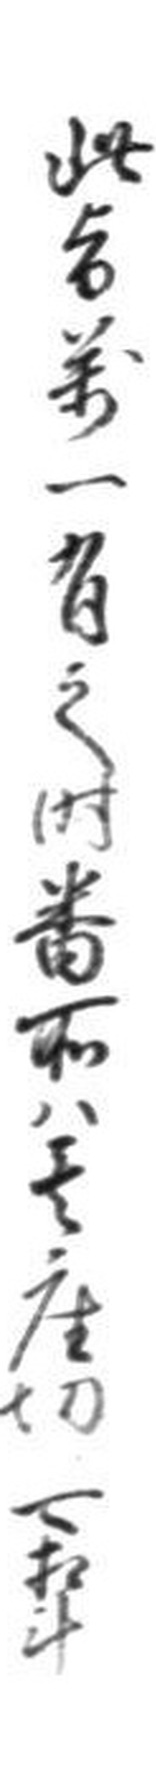此旨万一有之時番所ハ其座切可相斗
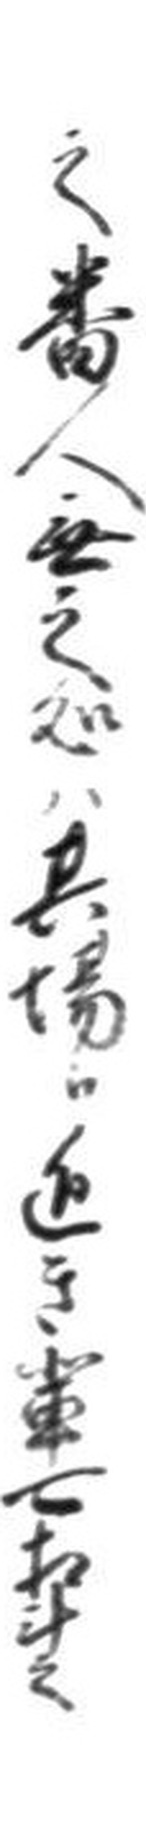之番人無之処ハ其場江近き輩可相斗之
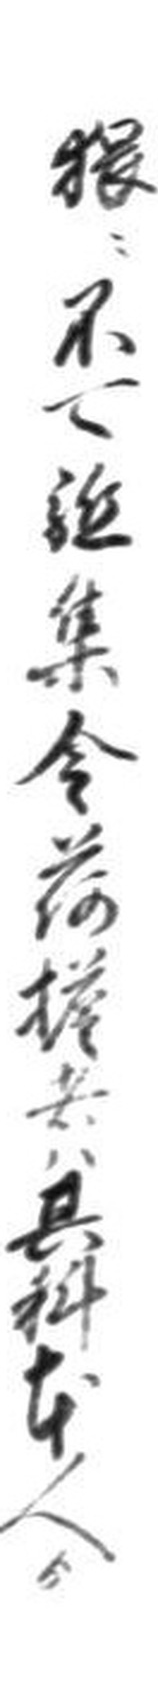猥ニ不可駈集令荷担者ハ其科本人ゟ
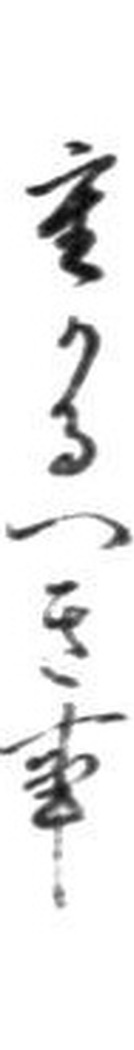重かるへき事
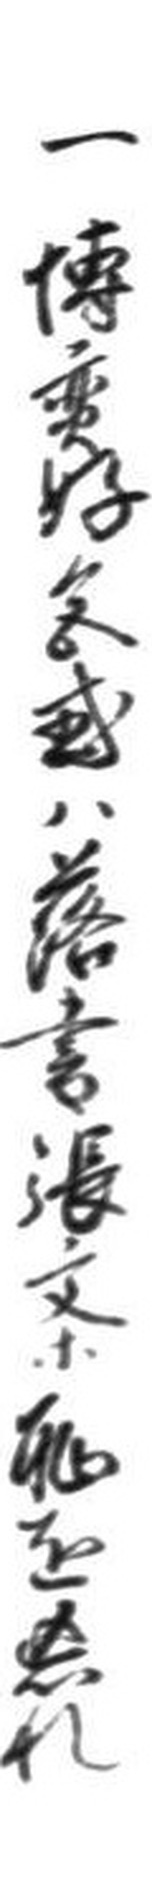一博奕好色或ハ落書張文等恥を忘れ
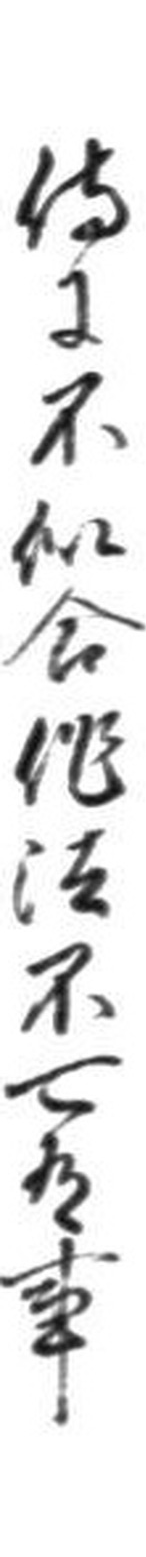侍に不似合作法不可有事

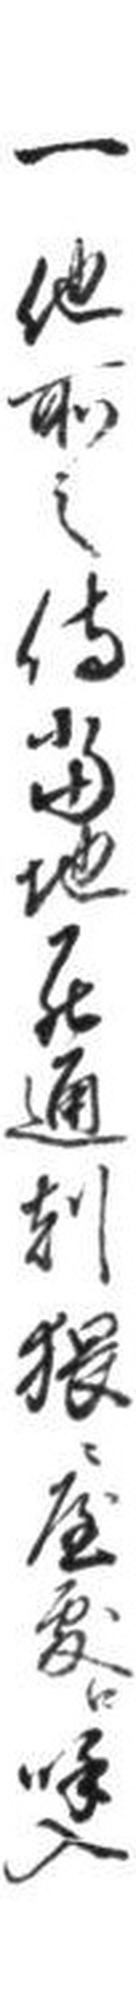一他所之侍当地罷通刻猥に屋敷え呼入
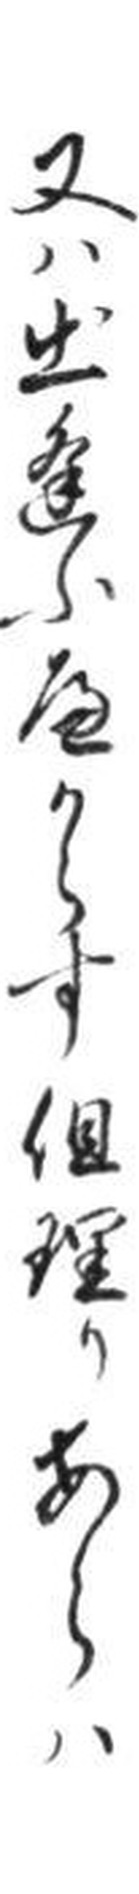又は出逢ふへからす但理りあらは
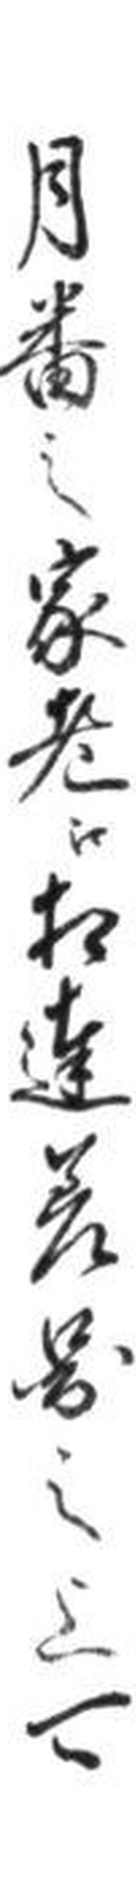月番之家老え相達差図之上可
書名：家譜 十六 吉品公 従貞享三年閏三月到同四年
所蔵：福井県文書館 Fukui Prefectural Archives
